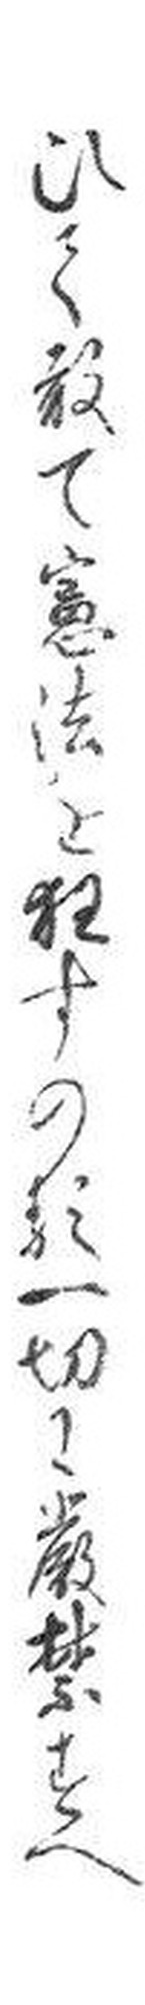ひて敢て憲法を犯すの類一切に厳禁すへ
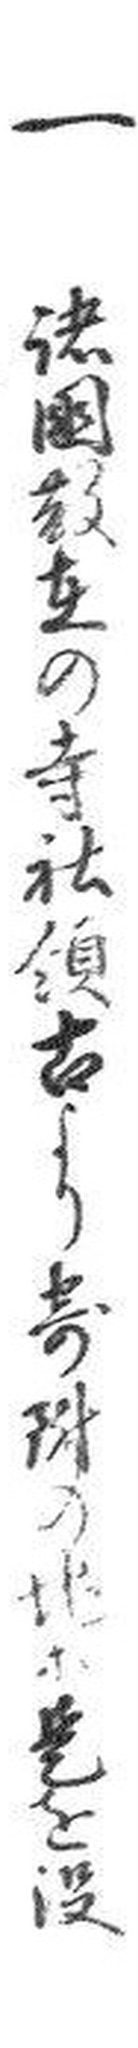一諸国散在の寺社領古より寄附の地等是を没
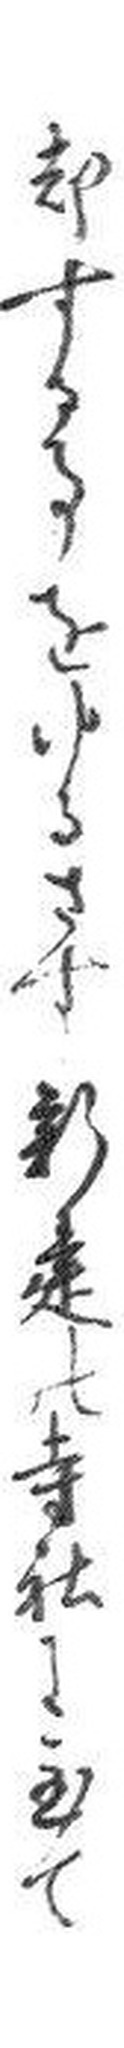却する事をゆるさす新建の寺社に至て
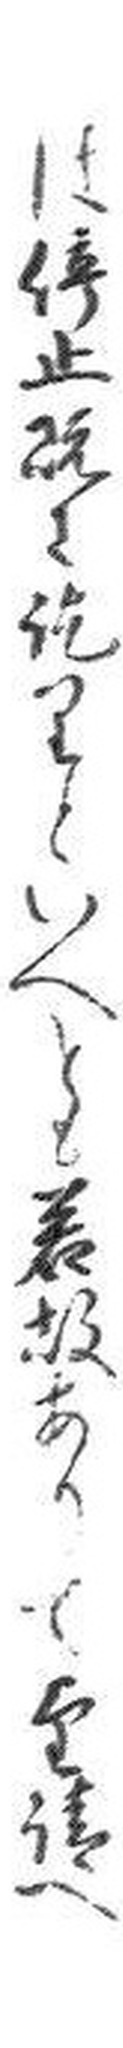は停止既に訖りといへとも若故ありて望請へ
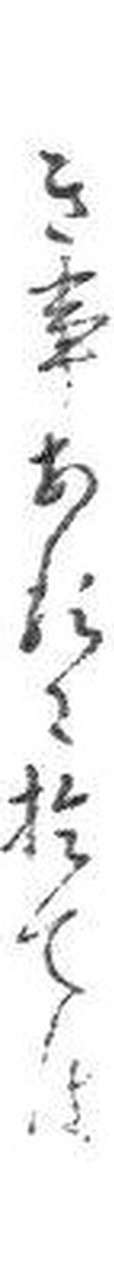き事あるに於ては
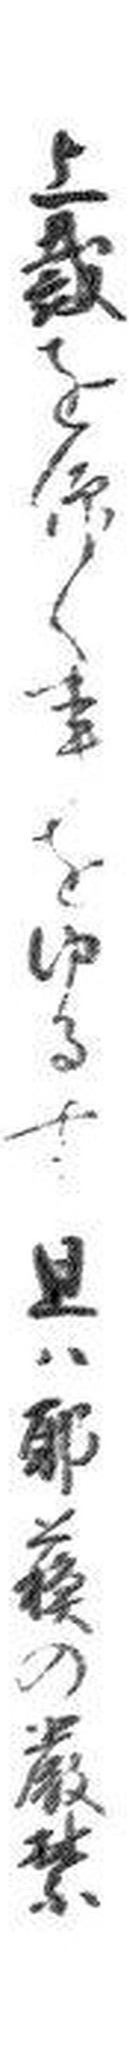上裁を仰く事をゆるす且は耶蘇の厳禁
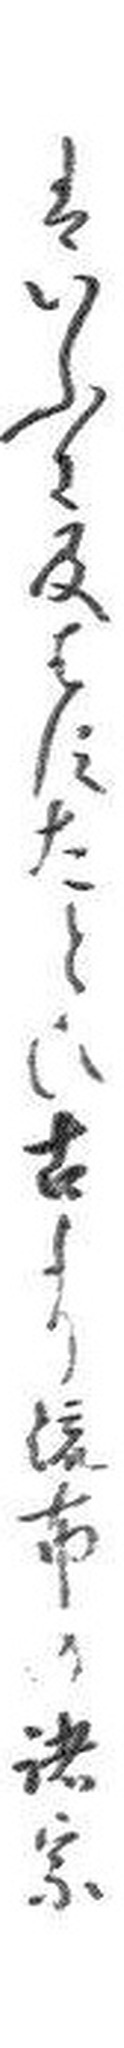はいふに及はすたとひ古より流布の諸宗
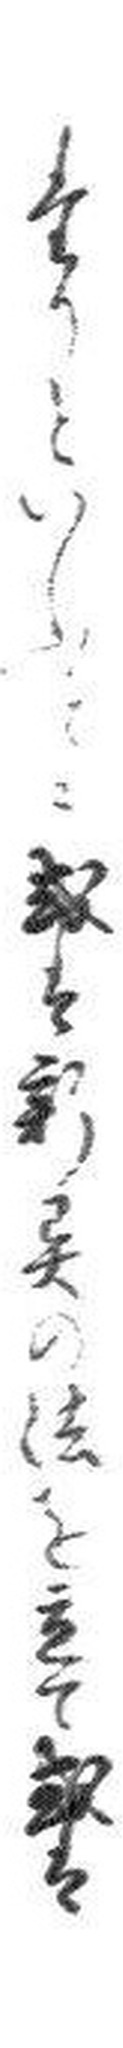たりといふとも或は新異の法を立て或は
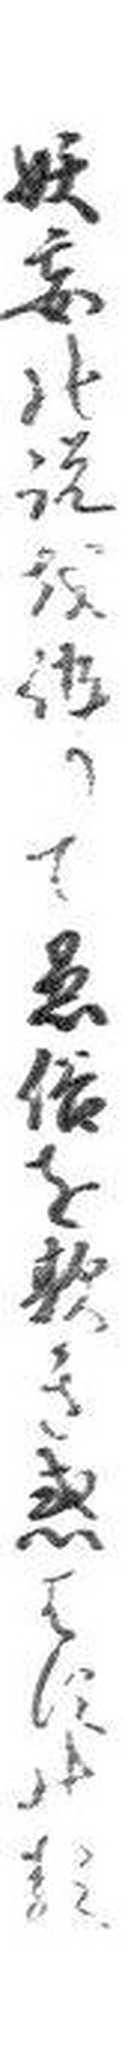妖妄の説を作りて愚俗を欺き惑はすの類
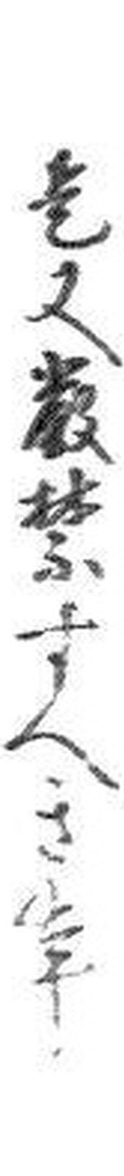是又厳禁すへき事
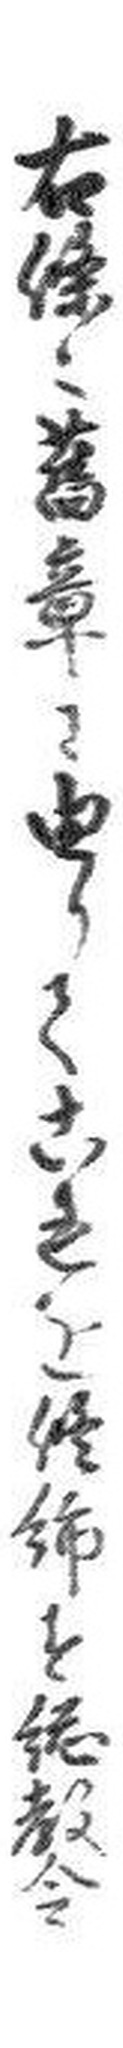右条々旧章に由りてこれを修飾す総教令
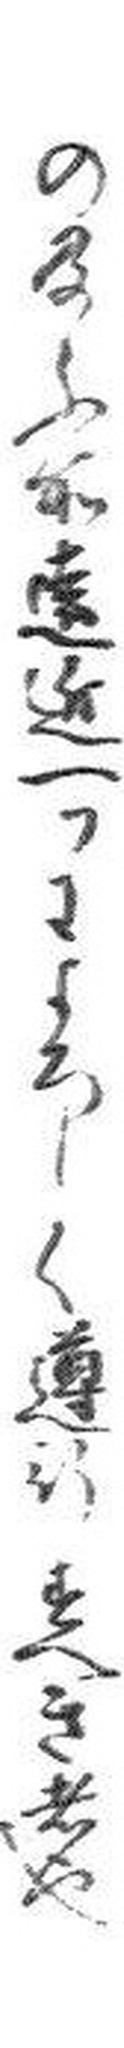の及ふ所遠近一つによろしく遵行すへき者也
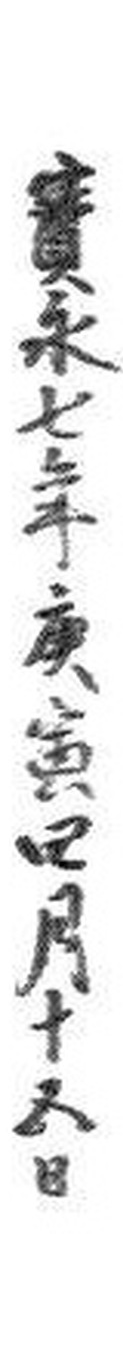宝永七年庚寅四月十五日

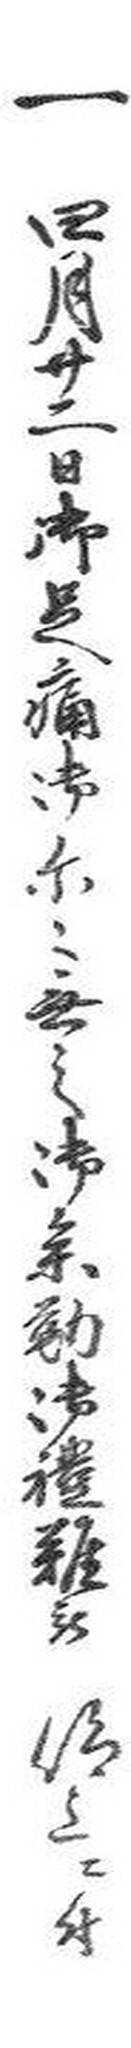一四月廿二日御足痛御尓々無之御参勤御礼難被仰上ニ付
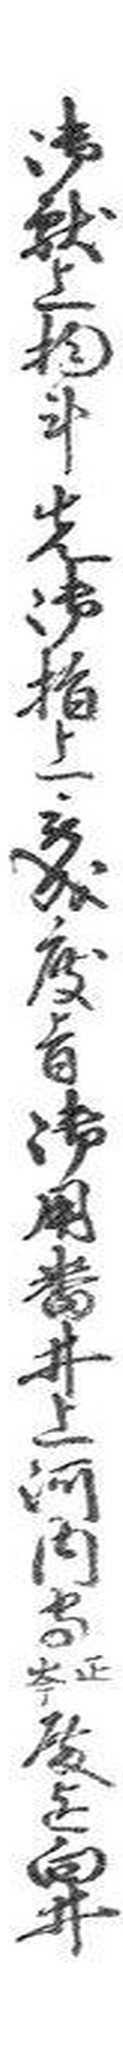御献上物計先御指上被成度旨御用番井上河内守正峯殿を向井
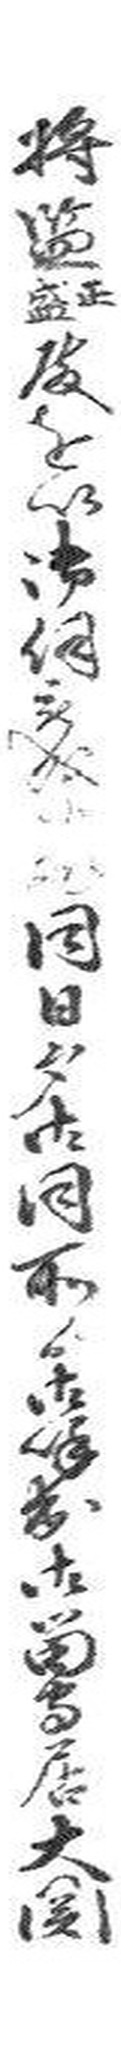将監正盛殿を以御伺被成候処同日夕御同所ゟ御呼出御留守居大関
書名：家譜 二十五 吉品公 従宝永六年到同七年
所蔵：福井県文書館 Fukui Prefectural Archives
